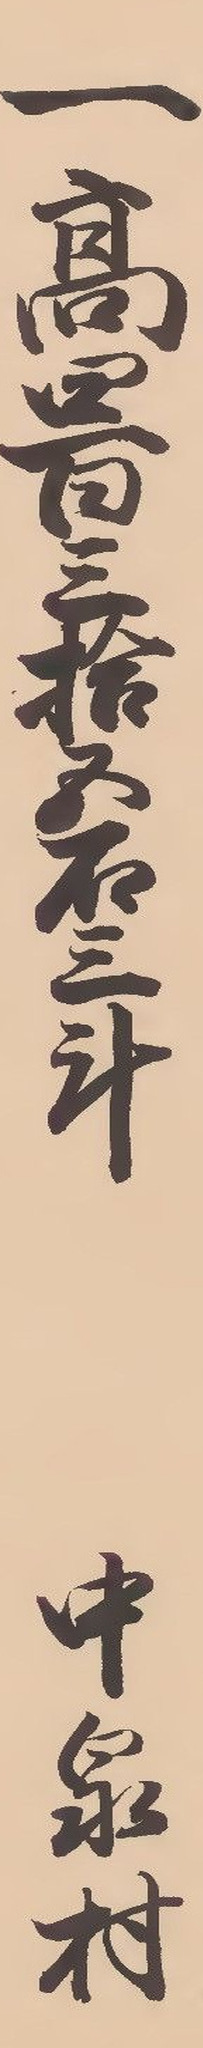一高四百三拾五石三斗中泉村
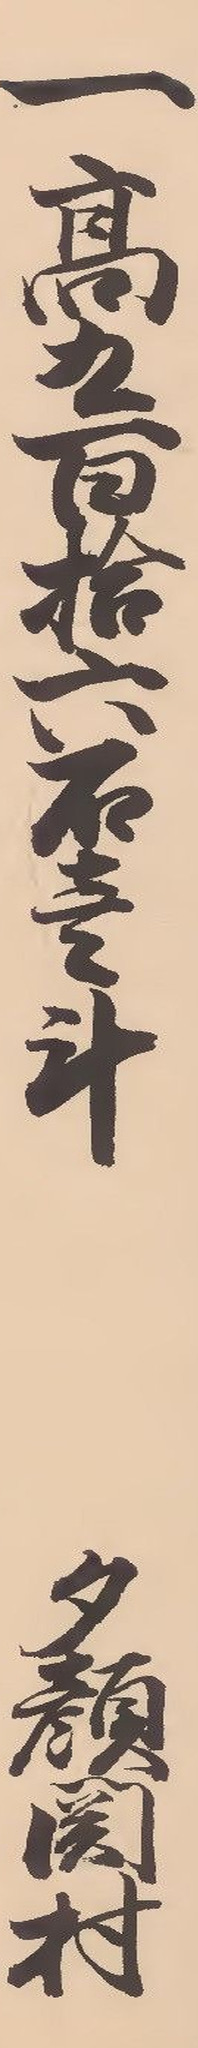一高九百拾六石壱斗夕顔関村
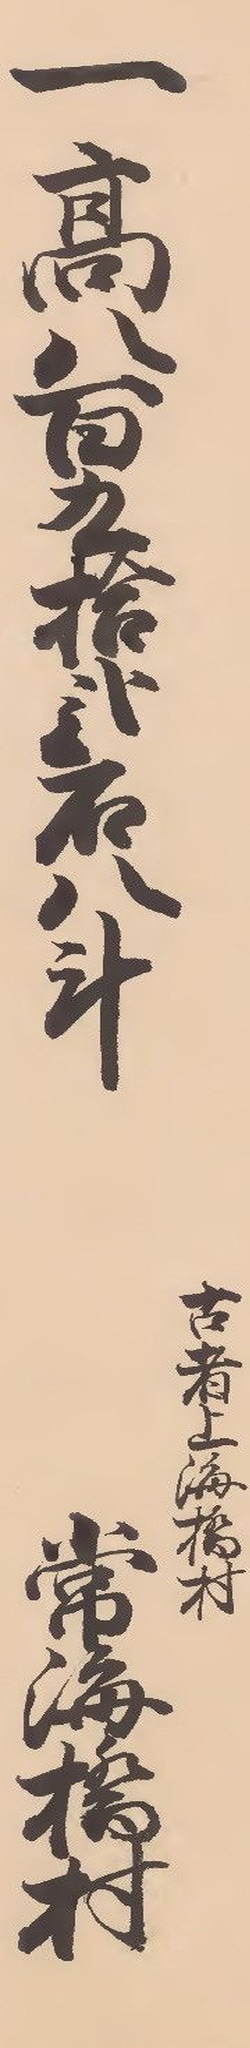一高八百九拾弐石八斗常海橋村
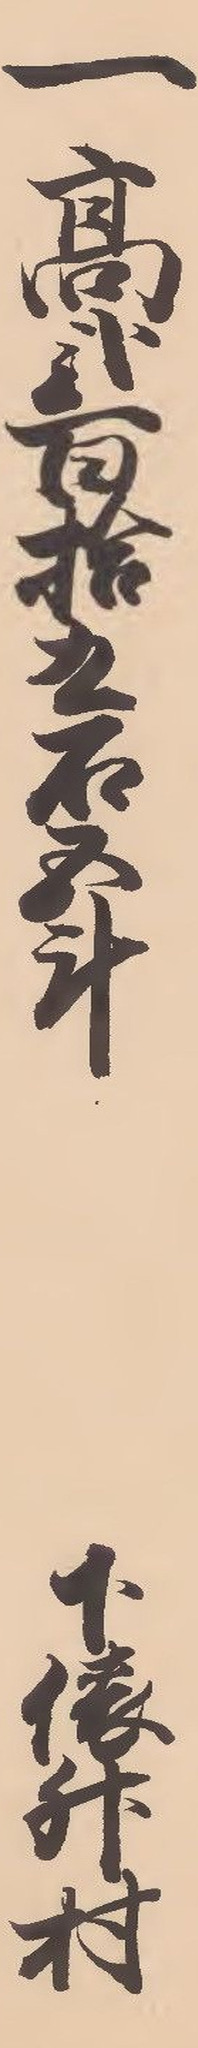一高弐百拾九石五斗下俵升村
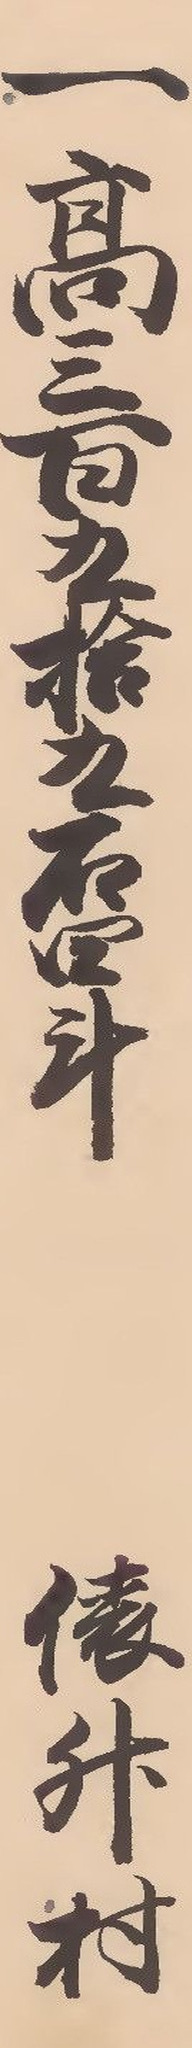一高三百九拾九石四斗俵升村

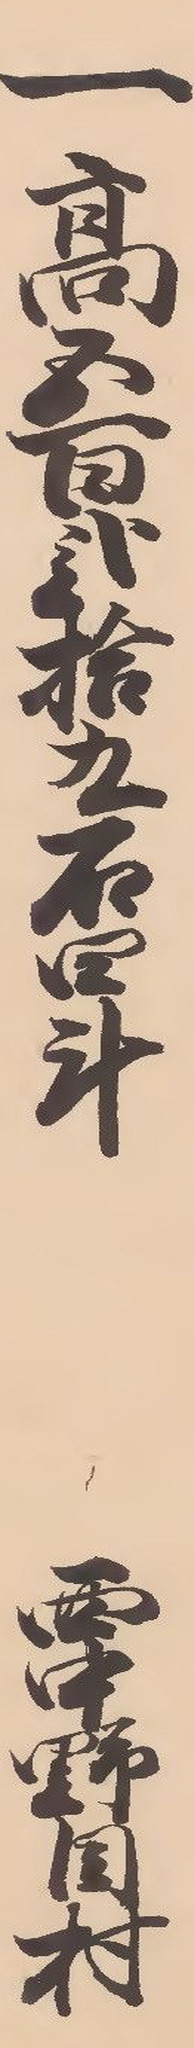一高五百弐拾九石四斗西中野目村
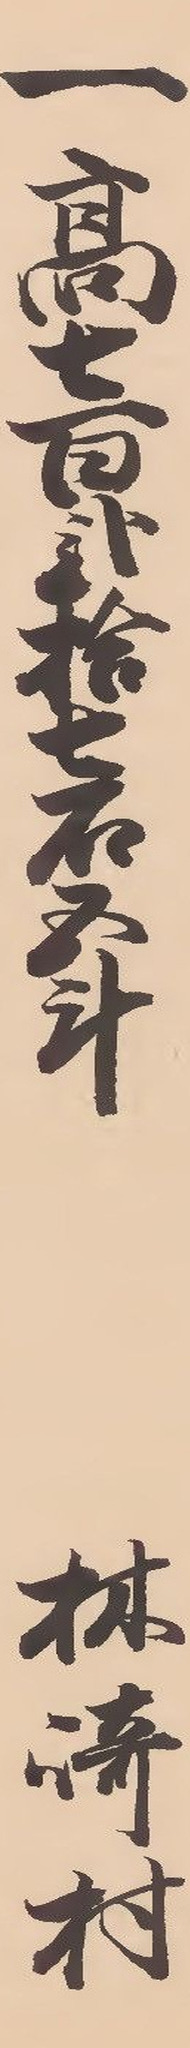一高七百弐拾七石五斗林崎村
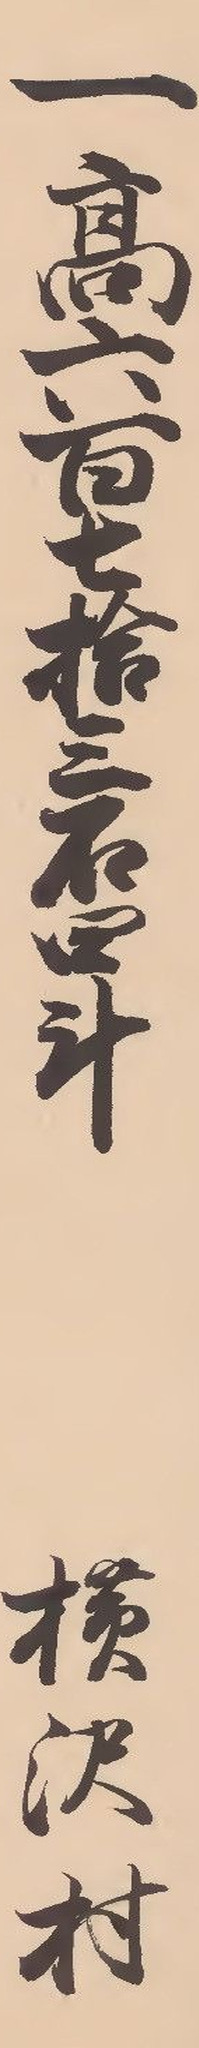一高六百七拾三石四斗横沢村
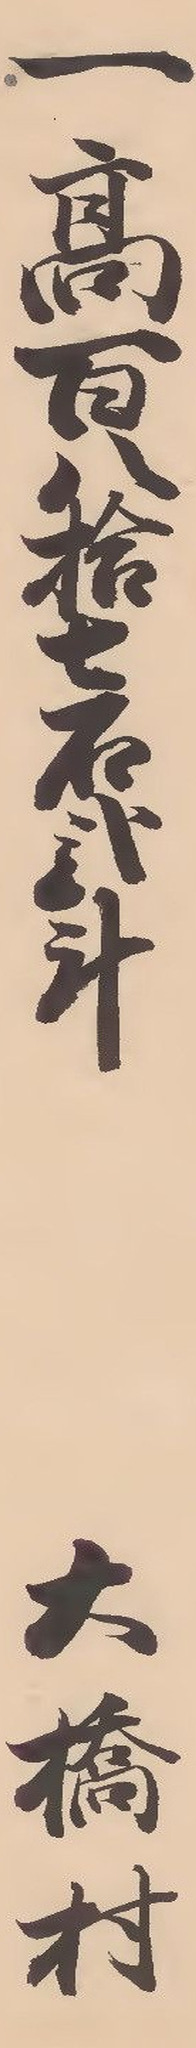一高百八拾七石弐斗大橋村

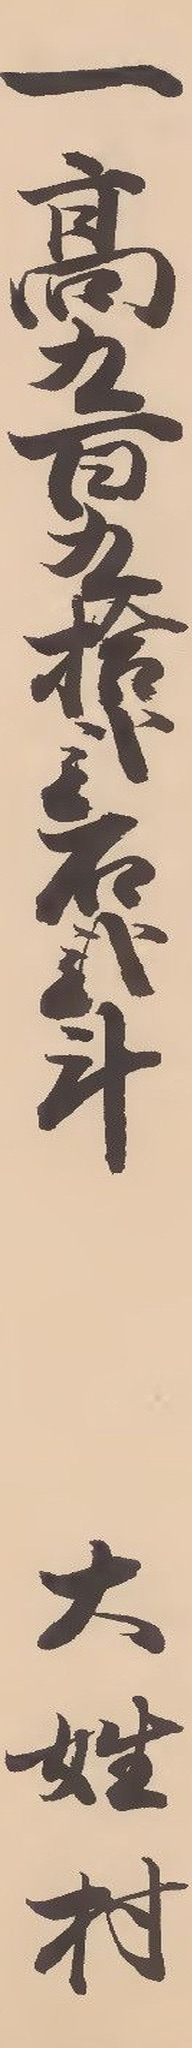一高九百九拾弐石弐斗大姓村
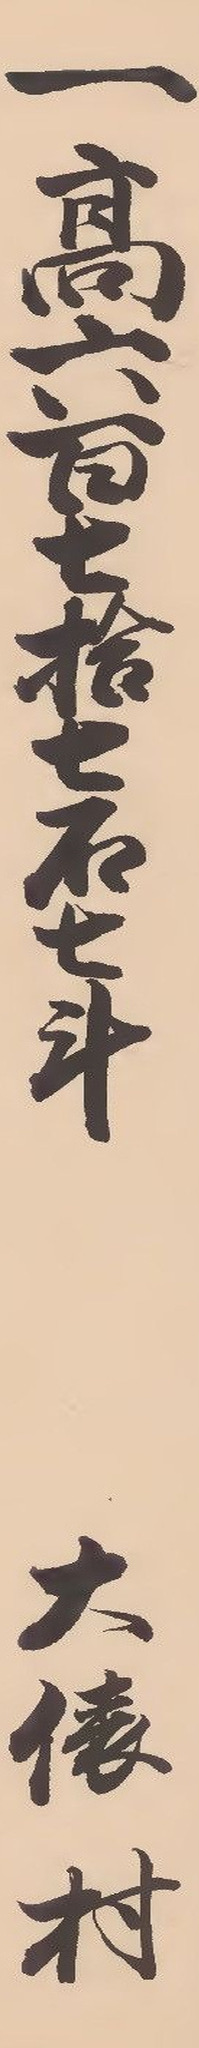一高六百七拾七石七斗大俵村
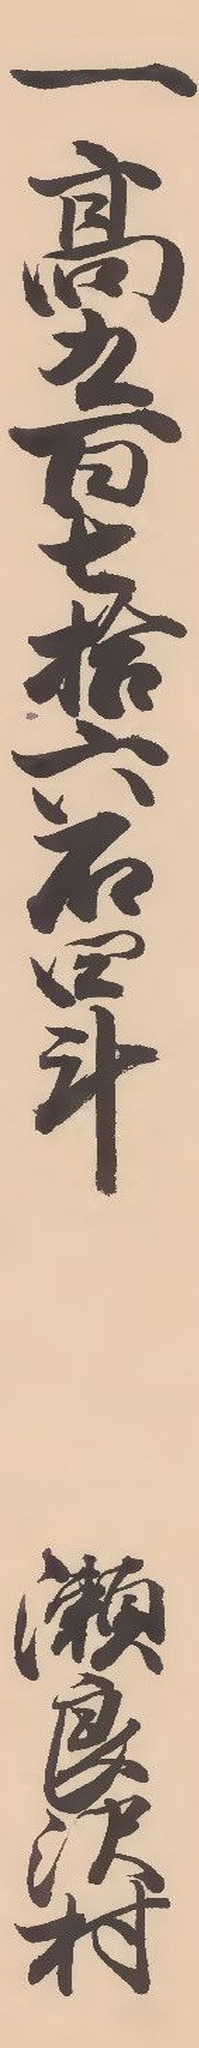一高九百七拾六石四斗瀬良沢村
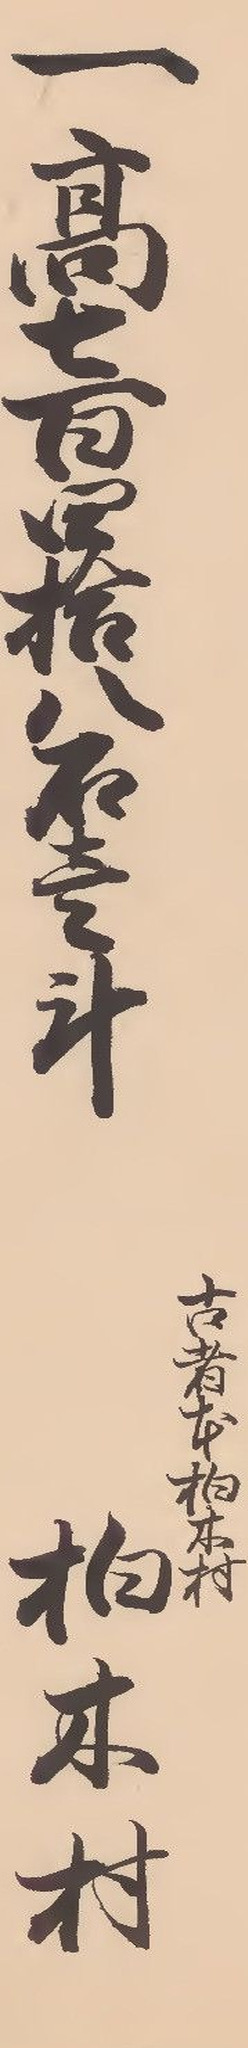一高七百四拾八石壱斗柏木村

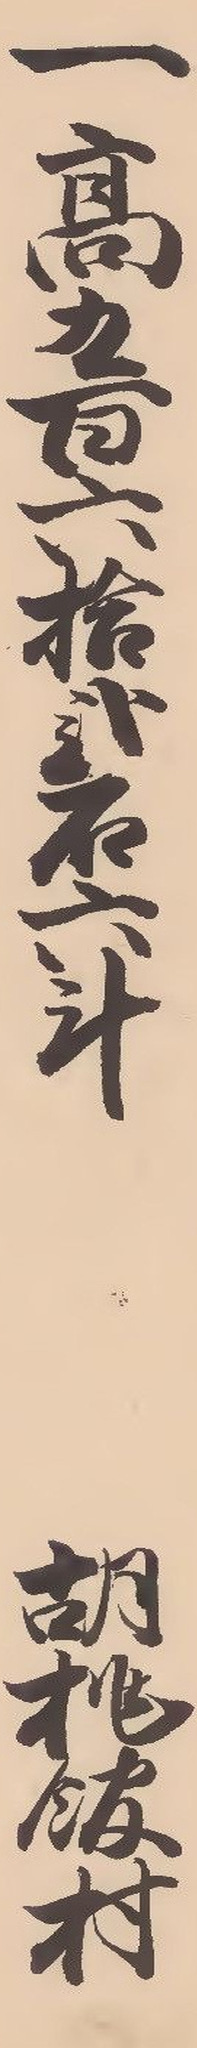一高九百六拾弐石六斗胡挑館村
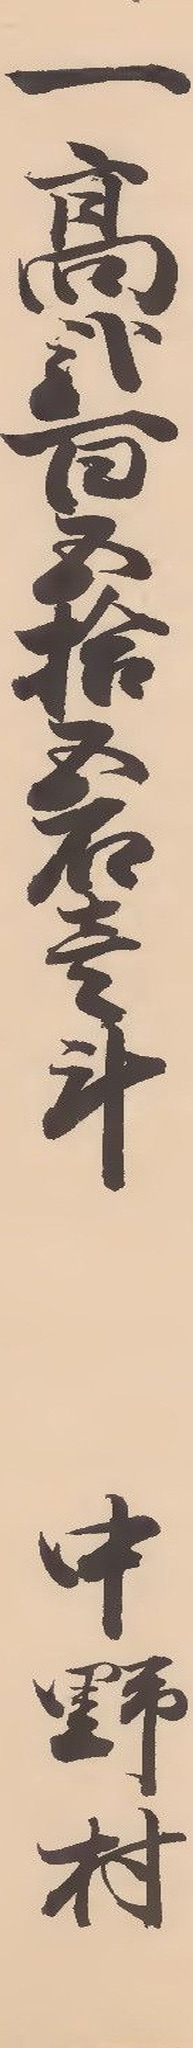一高弐百五拾五石壱斗中野村
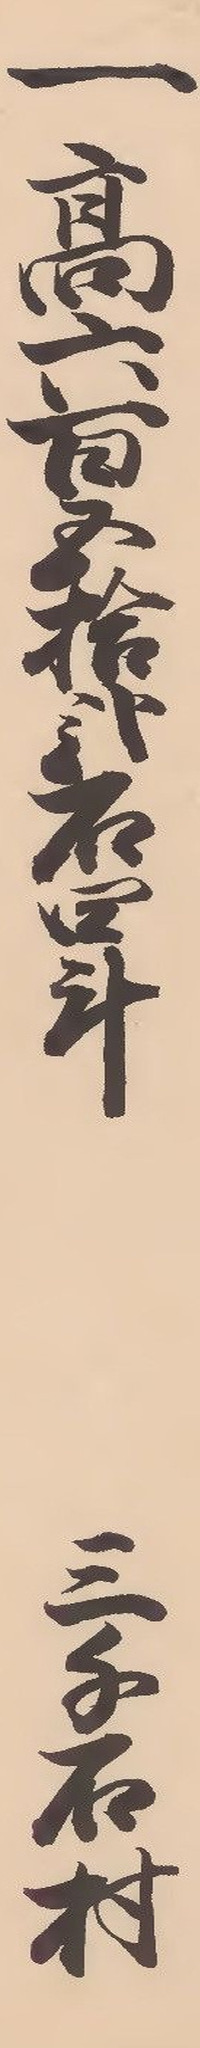一高六百五拾弐石四斗三千石村
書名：陸奥国郷帳　７
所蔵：国立公文書館 National Archives of Japan
